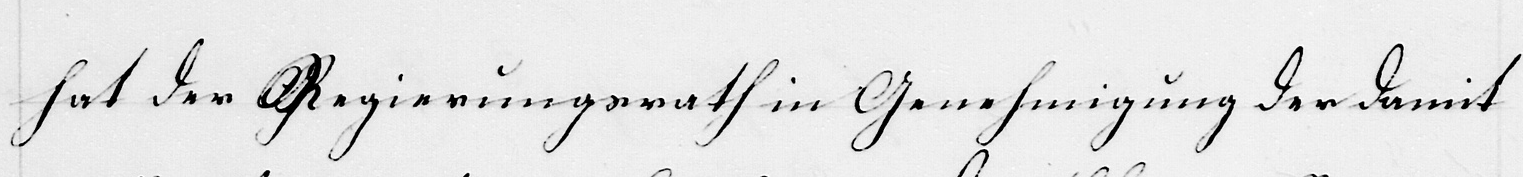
hat der Regierungsrath in Genehmigung der damit
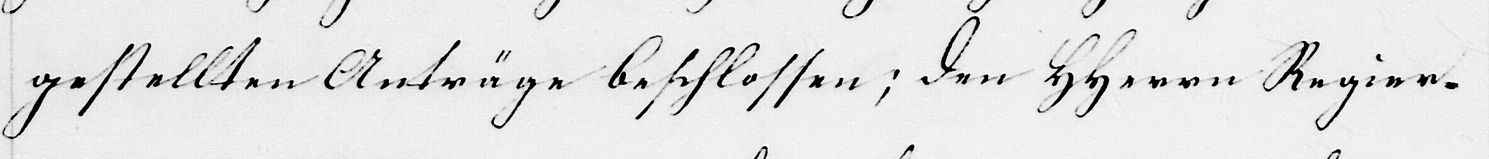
gestellten Anträge beschlossen; den HHerrn Regier¬
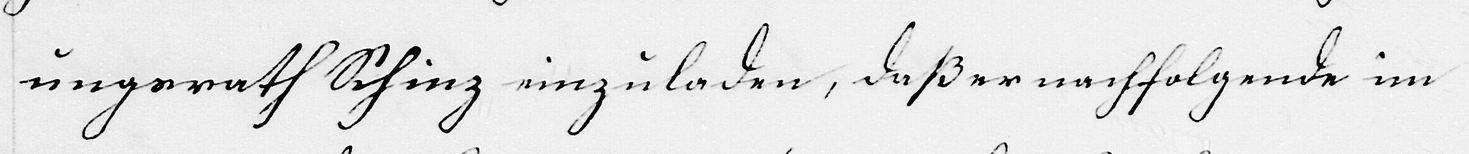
ungsrath Schinz einzuladen, daß er nachfolgende im
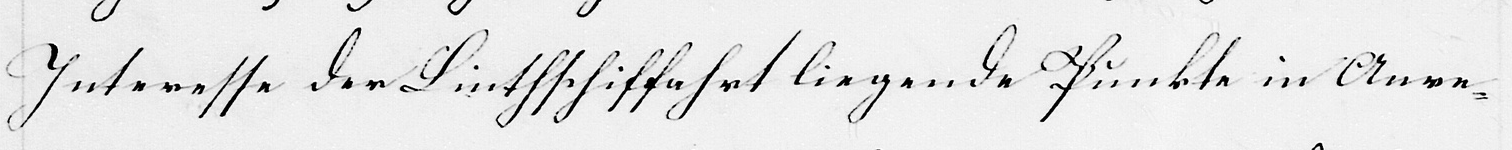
Interesse der Linthschiffahrt liegende Punkte in Anre¬
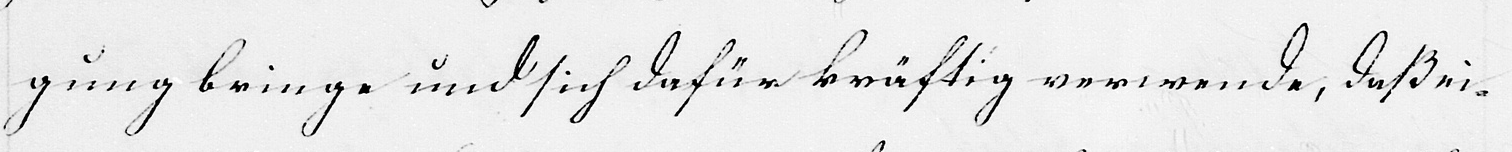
gung bringe und sich dafür kräftig verwende, daß ei¬
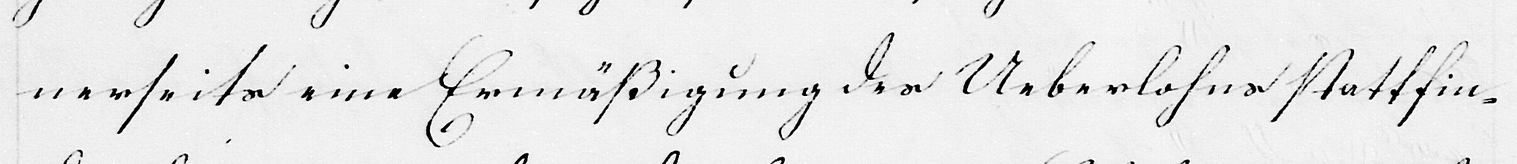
nerseits eine Ermäßigung des Ueberlohns stattfin¬
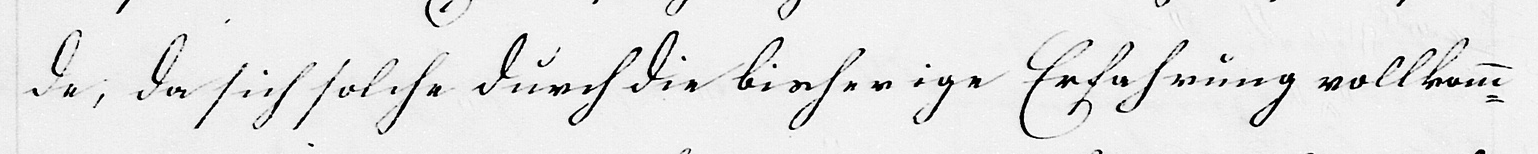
de, da sich solche durch die bisherige Erfahrung vollkom¬
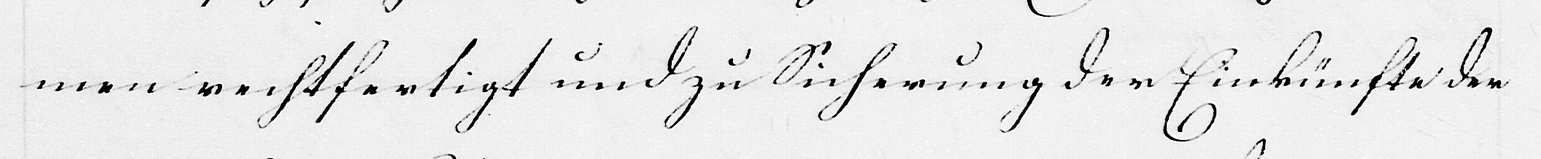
men rechtfertigt und zu Sicherung der Einkünfte der
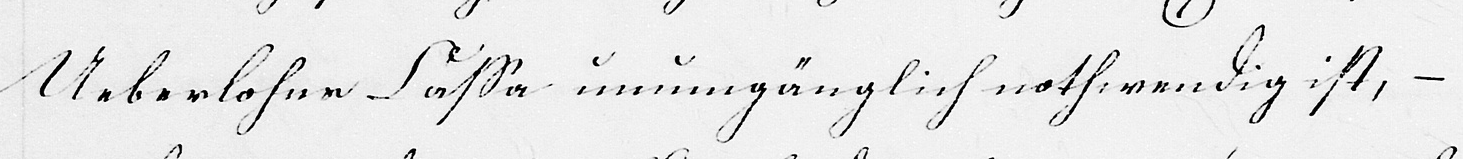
Ueberlohns Caßa unumgänglich nothwendig ist, –
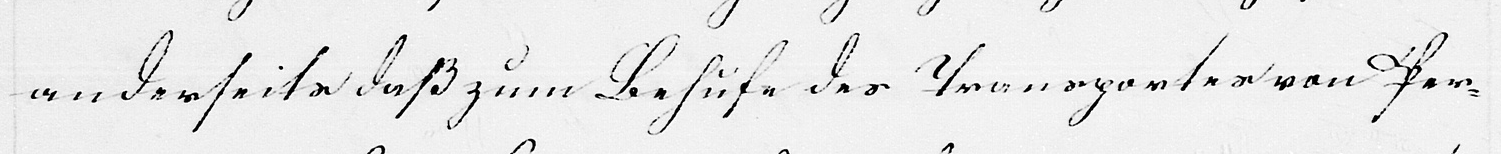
anderseits daß zum Behufe des Transportes von Per¬
